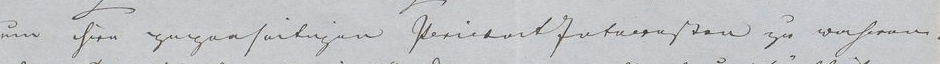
um ihre gegenseitigen Privat Intereßen zu wahren.
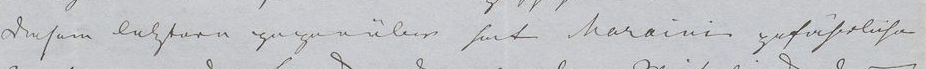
Diesem letztern gegenüber hat Maraini gefährliche
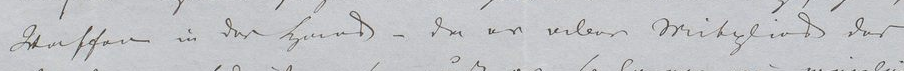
Waffen in der Hand, da er aber Mitglied des
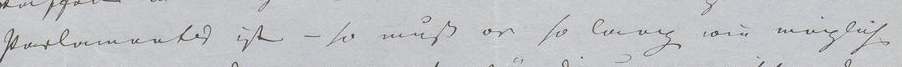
Parlaments ist, so muß er so lang wie möglich
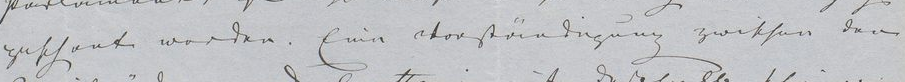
geschont werden. Eine Verständigung zwischen den
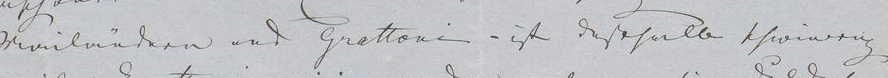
Mailändern und Grattoni, ist deßhalb schwierig
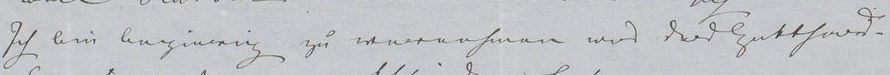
Ich bin begierig zu vernehmen was das Gotthard -
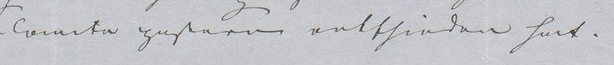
Comite gestern entschieden hat. –
